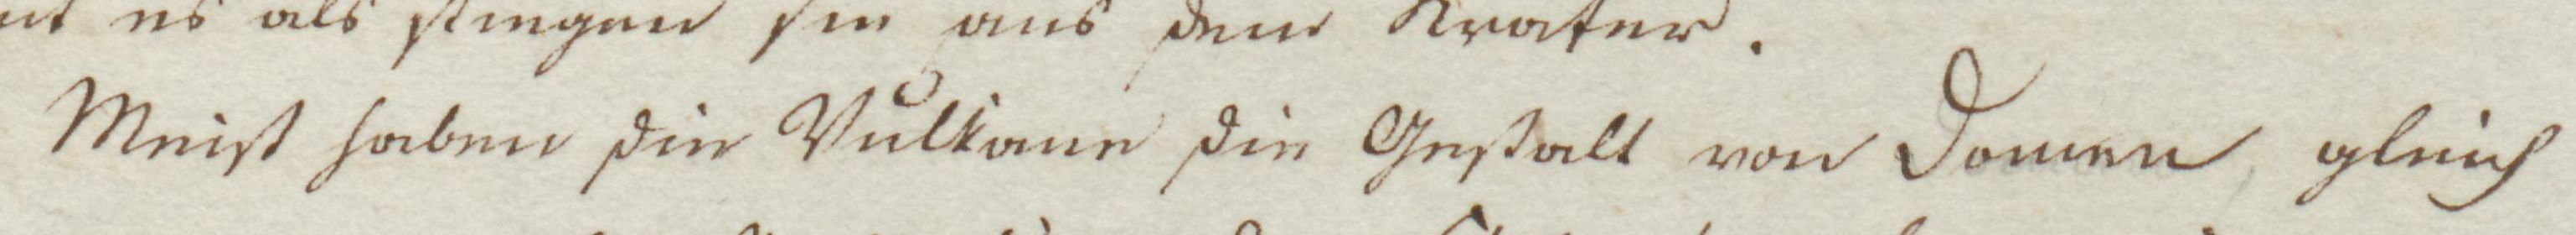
Meist haben die Vulkane die Gestalt von Domen gleich
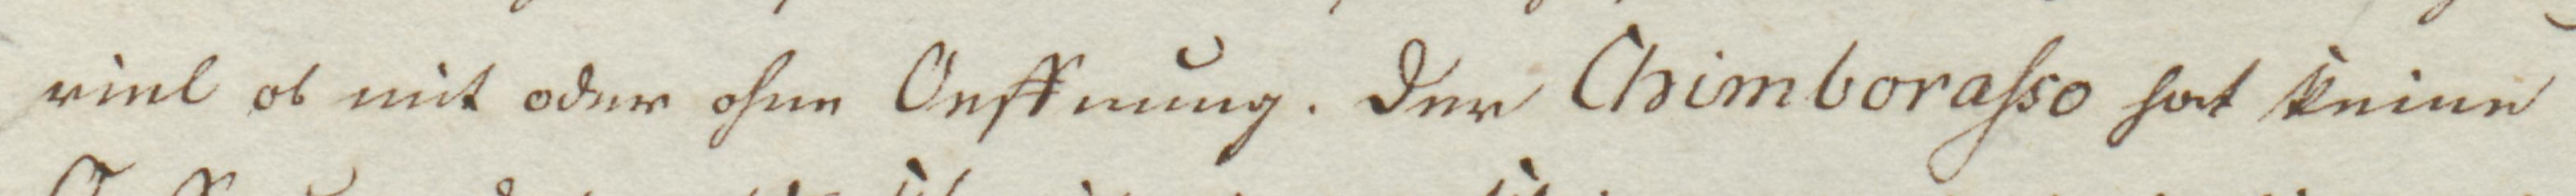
viel ob mit oder ohne Oeffnung. Der Chimborasso hat keine
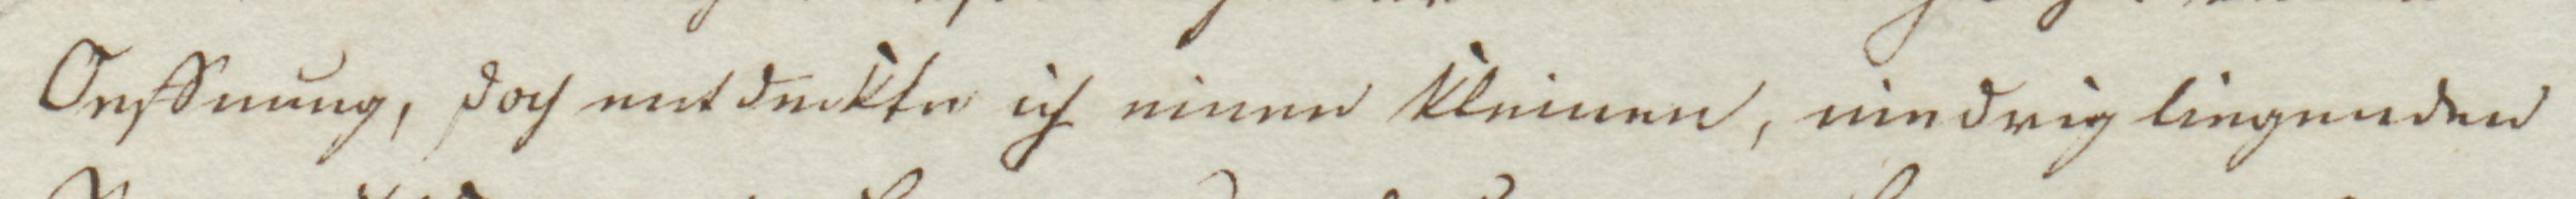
Oeffnung, doch entdeckte ich einen kleinen, niedrig liegenden
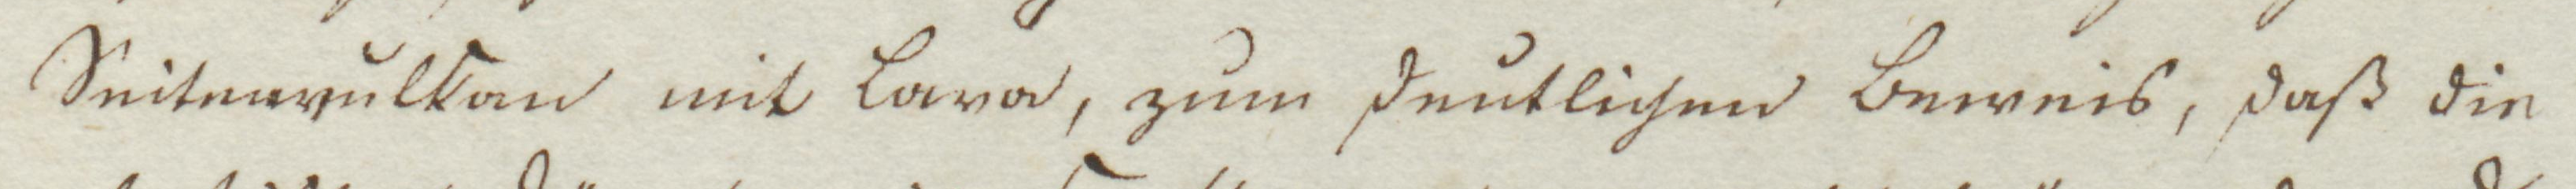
Seitenvulkan mit Lava, zum deutlichen Beweis, daß die
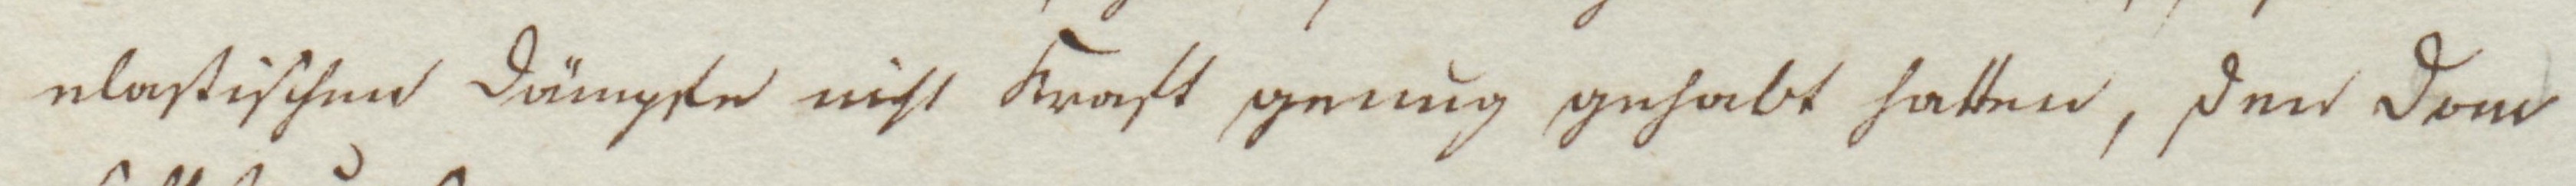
elastischen Dämpfe nicht Kraft genug gehabt hatten, den Dom
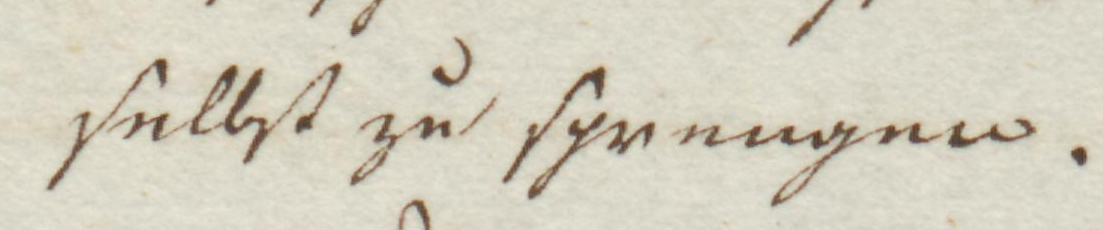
selbst zu sprengen.
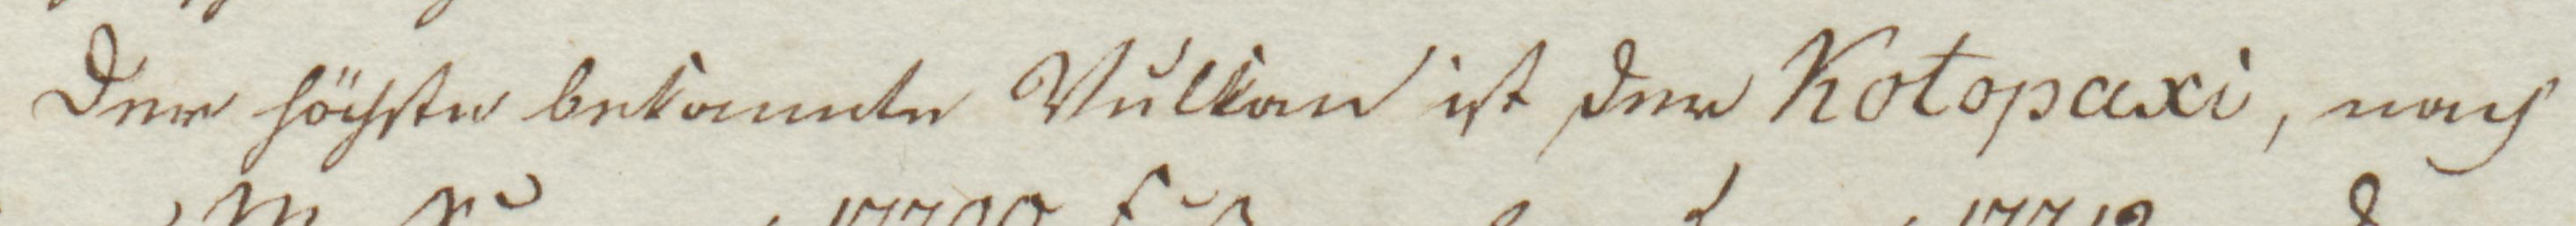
Der höchste bekannte Vulkan ist der Kotopaxi, nach
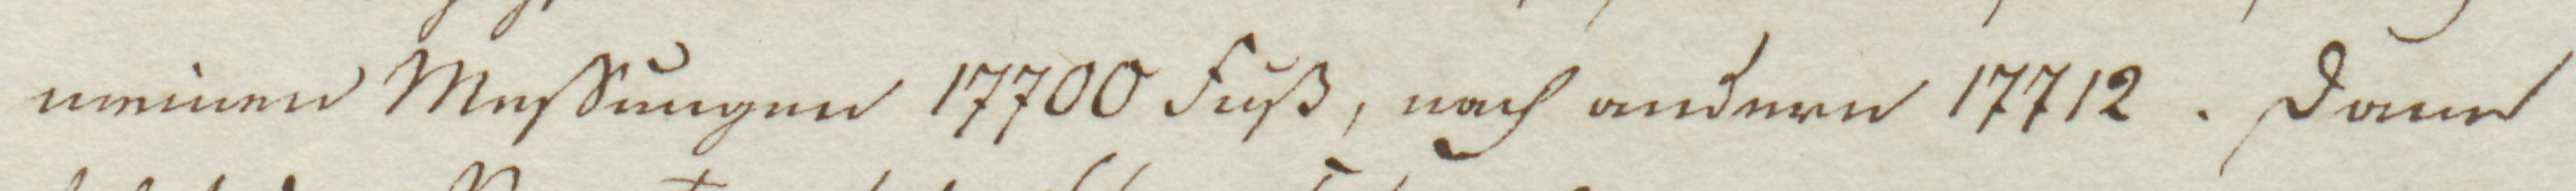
meinen Messungen 17700 Fuß, nach andern 17712. Dann
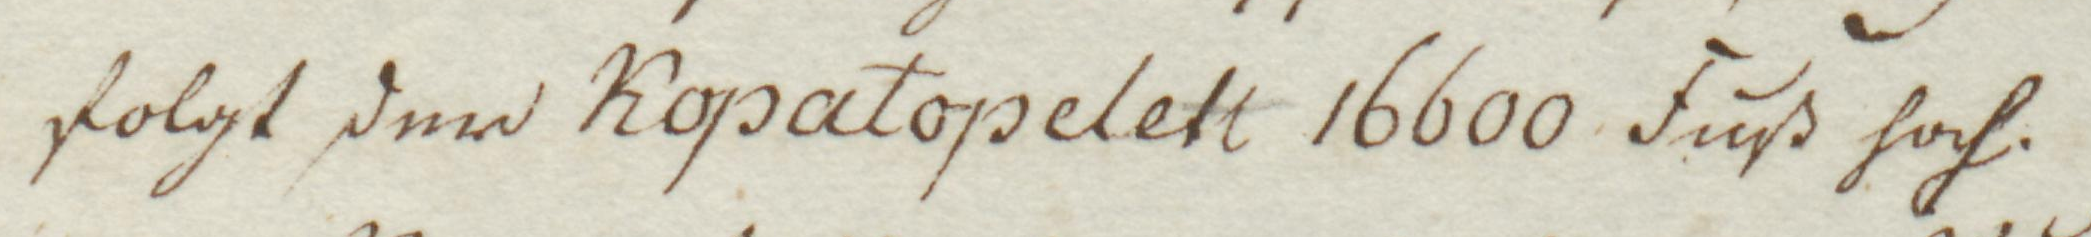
folgt der Kopatopeletl 16600 Fuß hoch.
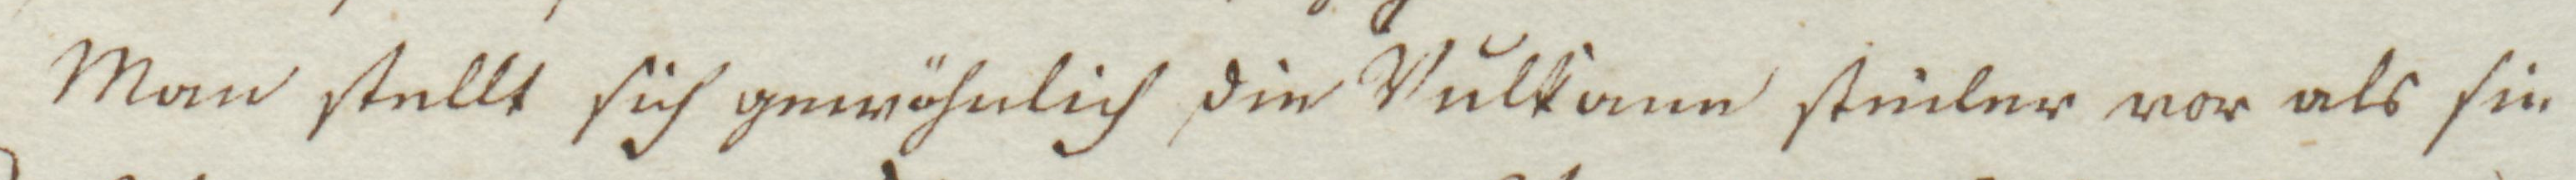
Man stellt sich gewöhnlich die Vulkane steiler vor als sie
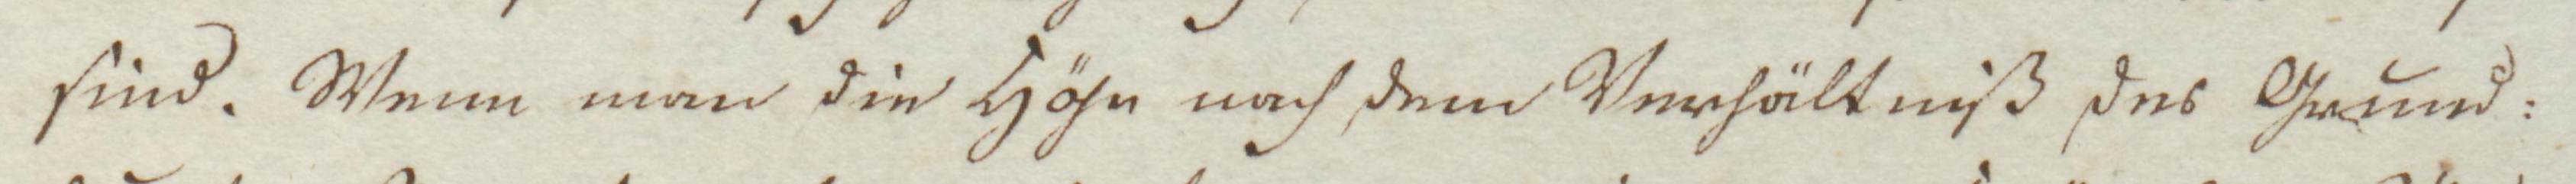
sind. Wenn man die Höhe nach dem Verhältniß des Grund-
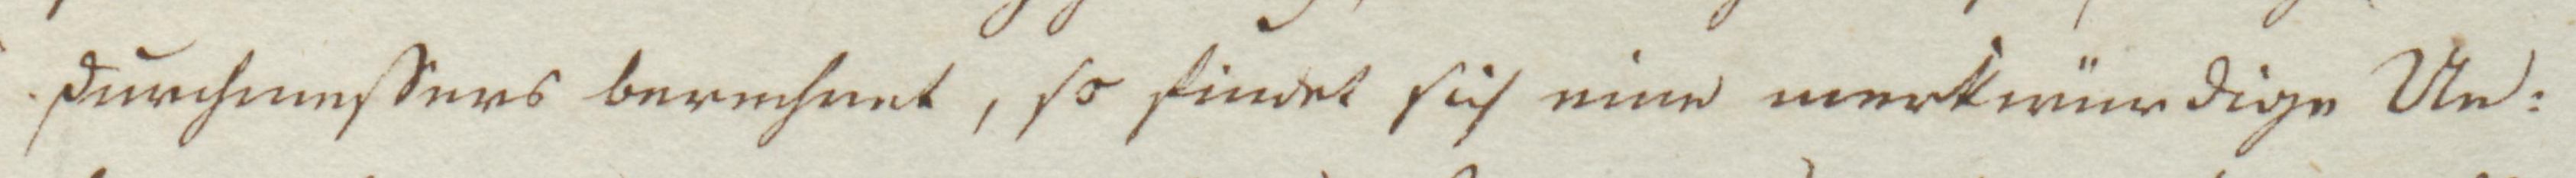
durchmessers berechnet, so findet sich eine merkwürdige Ue-
